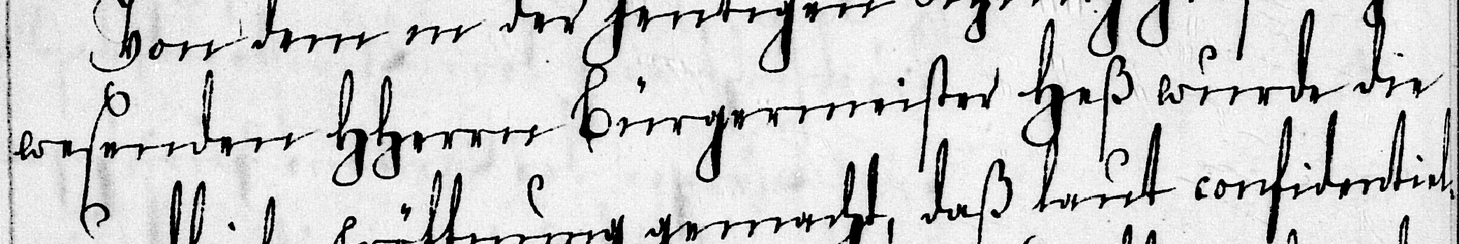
wesenden HHerrn Bürgermeister Heß wurde die
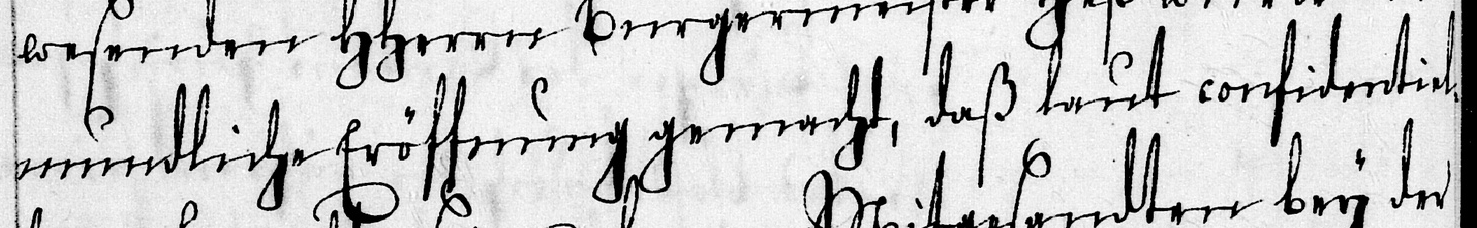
mundliche Eröffnung gemacht, daß laut confidentiel¬
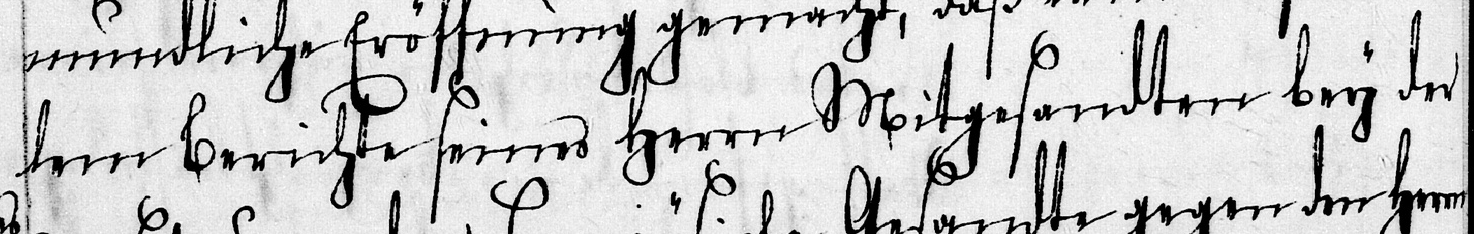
lem Berichte seines Herrn Mitgesandten bey der
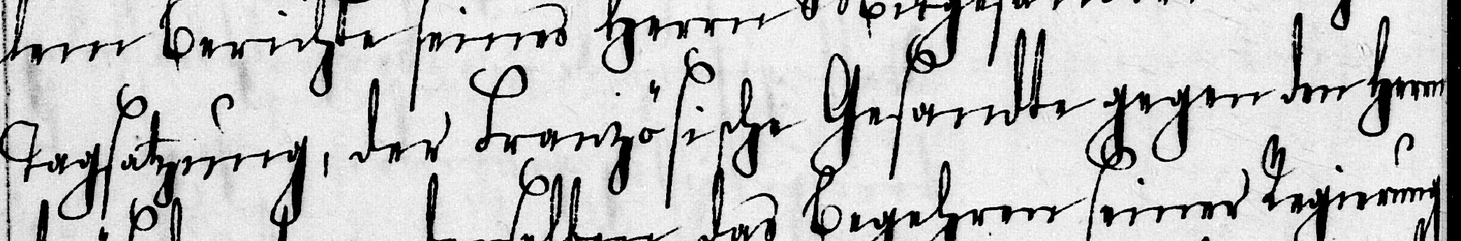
Tagsatzung, der Französische Gesandte gegen den Her¬
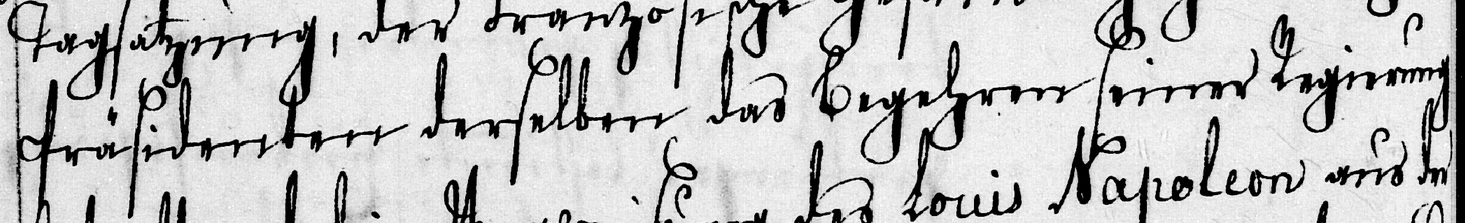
Präsidenten derselben das Begehren seiner Regierung
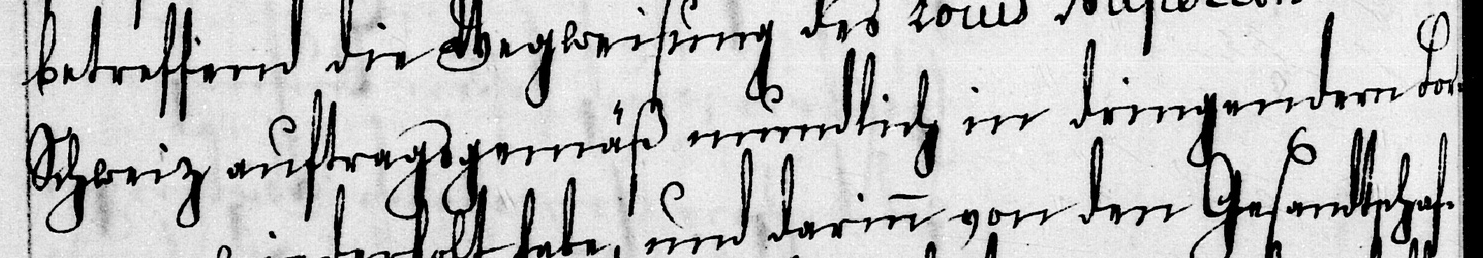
Schweiz auftragsgemäß mundlich in dringendern For¬
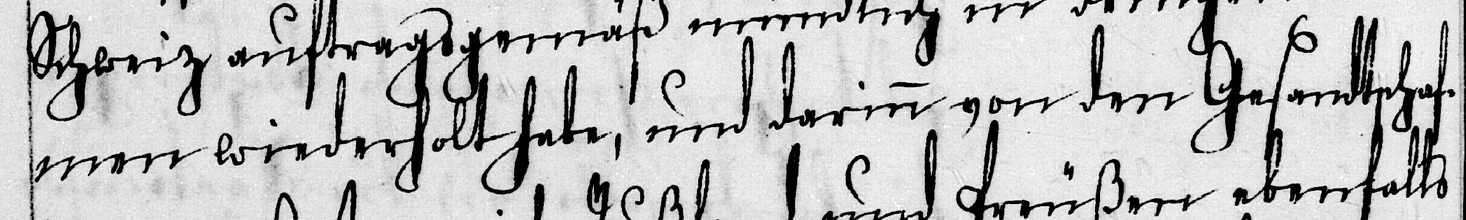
men wiederholt habe, und darinn von den Gesandtsch¬
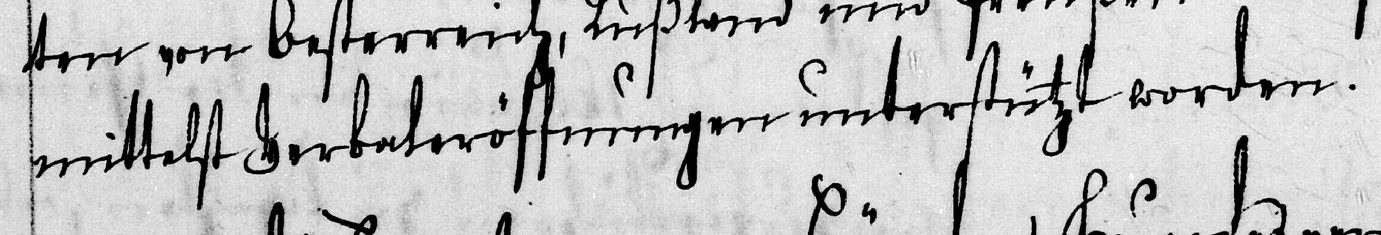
mittelst Verbaleröffnungen unterstützt worden.
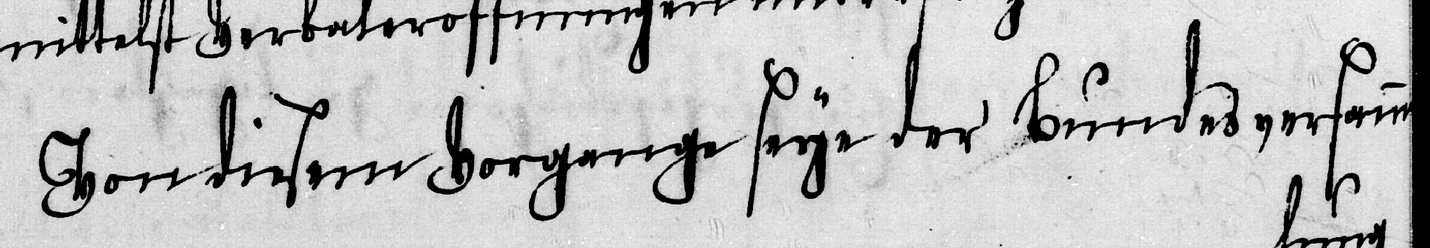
Von diesem Vorgange seye der Bundesversam-
